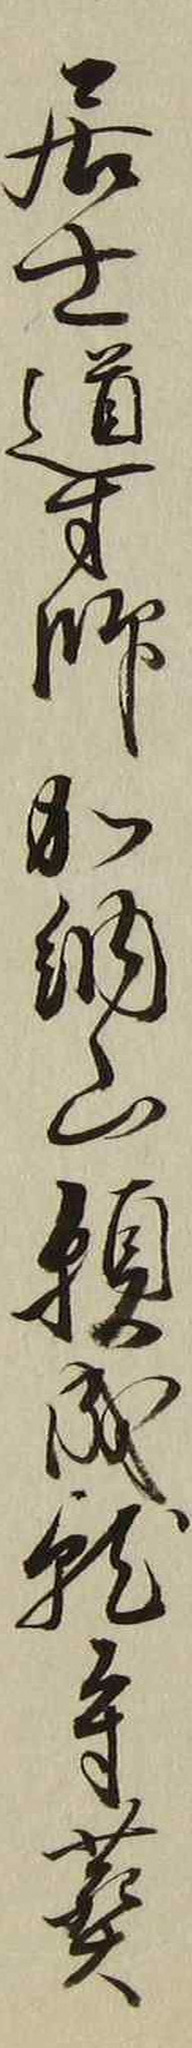居士導師加納山願成就寺葬
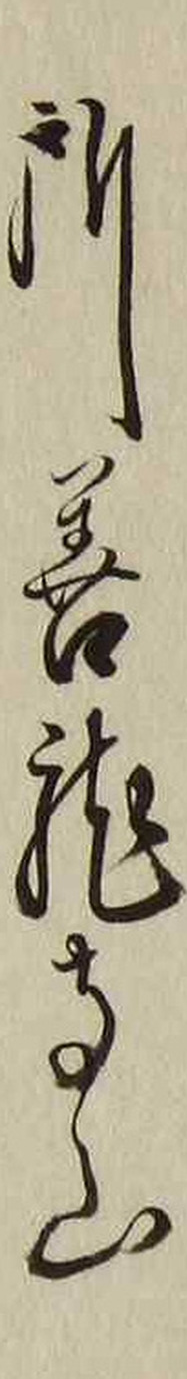所善龍寺山

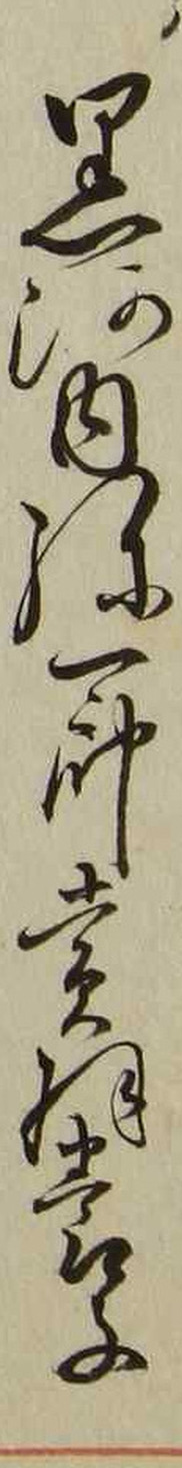黒河内弥一郎賞羽養子
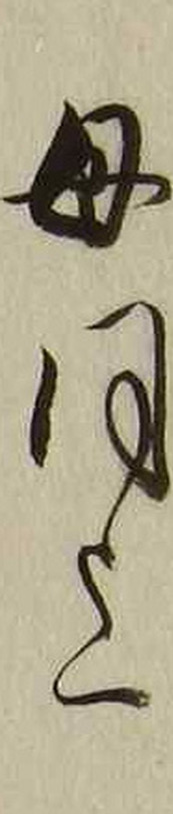母同上
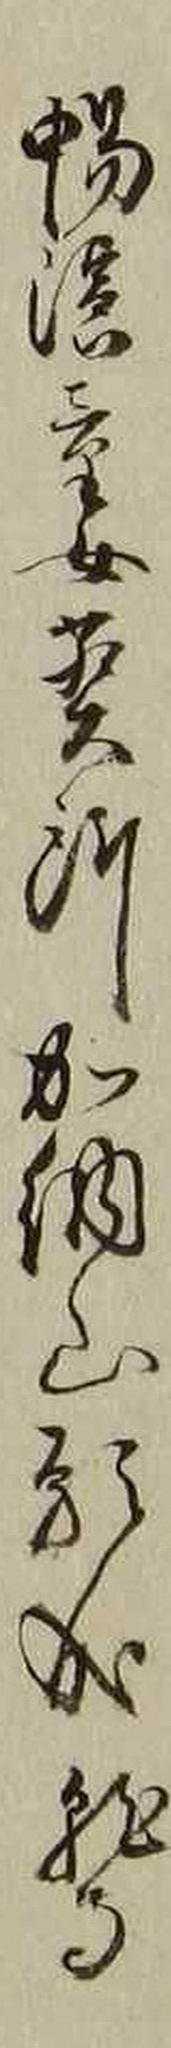暢演童女葬所加納山願成就寺
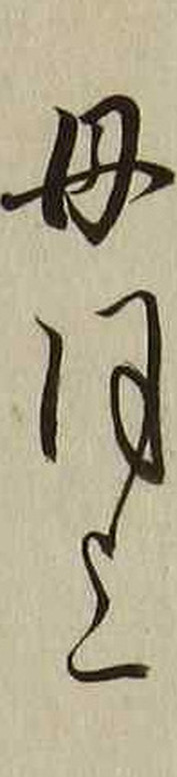母同上
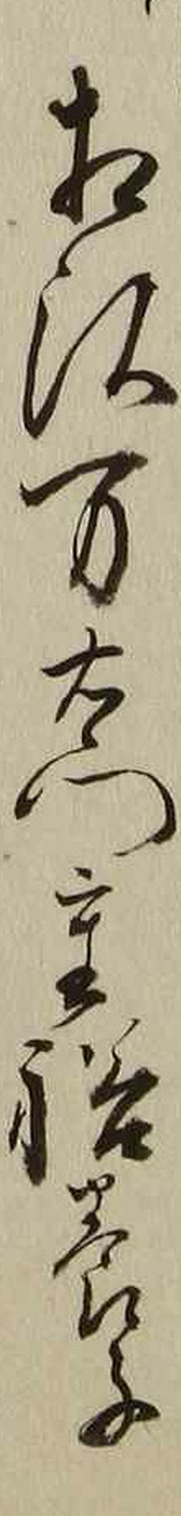相沢万右衛門重裕養子
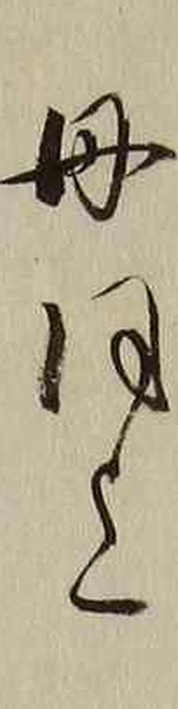母同上
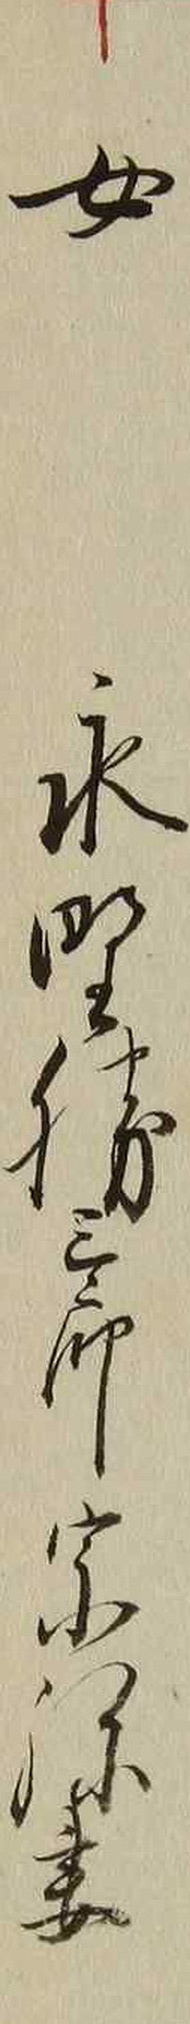女永野勝三郎宗弥妻
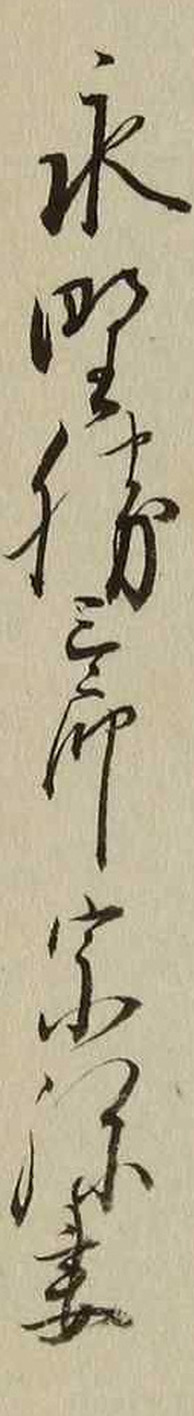女永野勝三郎宗弥妻
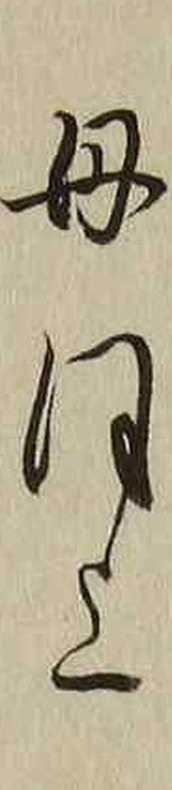母同上
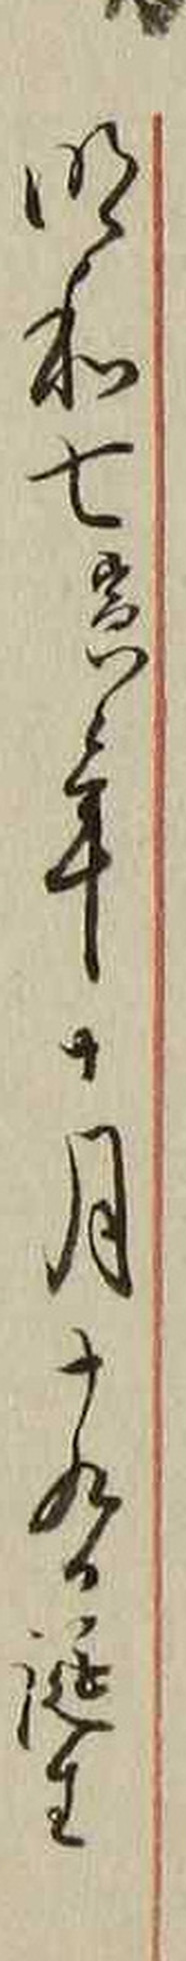明和七寅年十月十九日誕生
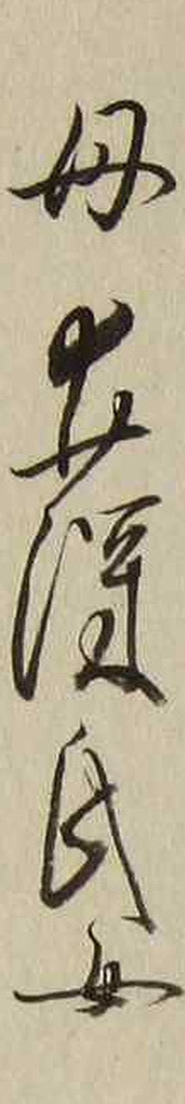母井深氏女
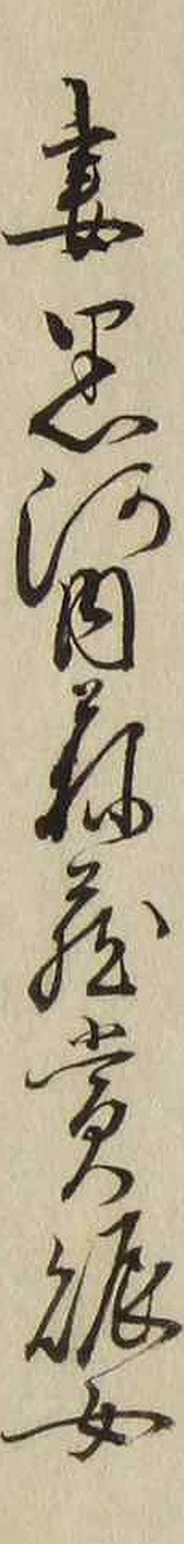妻黒河内藤蔵賞賑女

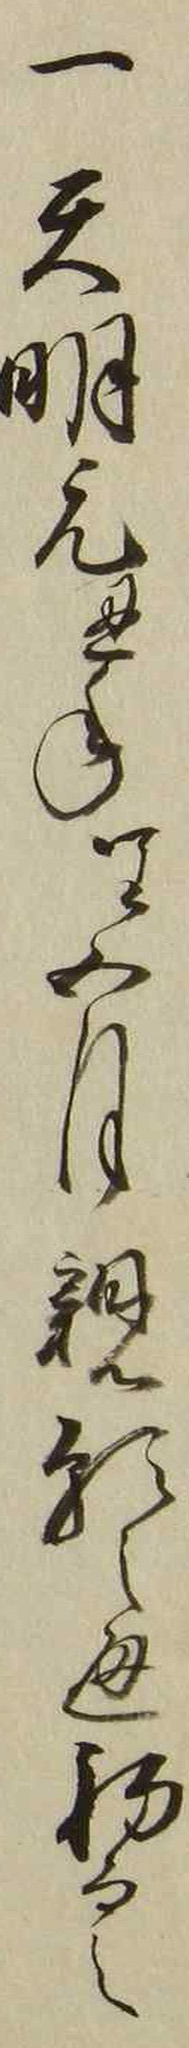一天明元丑年閏五月親願之通初而之
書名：諸士系譜　巻之2　い之部2
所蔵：会津若松市立会津図書館
